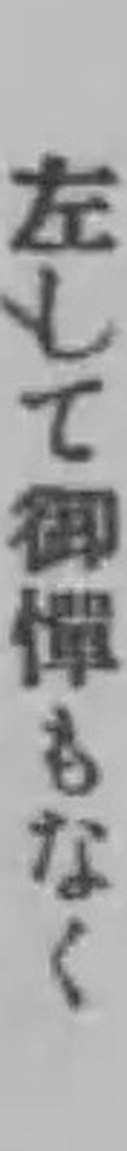左して御憚もなく
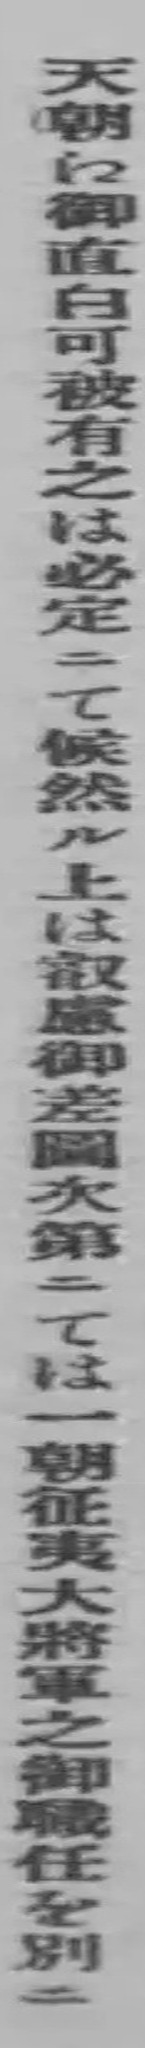天朝え御直白可被有之は必定ニて候然ル上は叡慮御差図次第ニては一朝征夷大将軍之御職任を別ニ
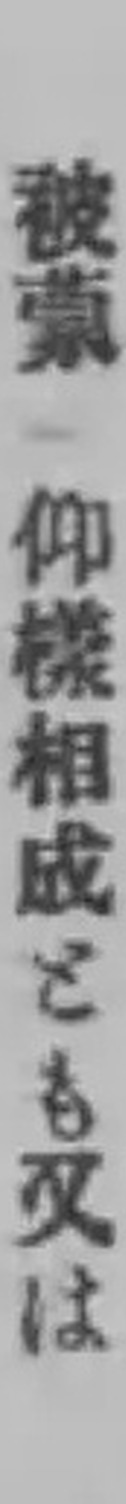被蒙仰様相成とも又は
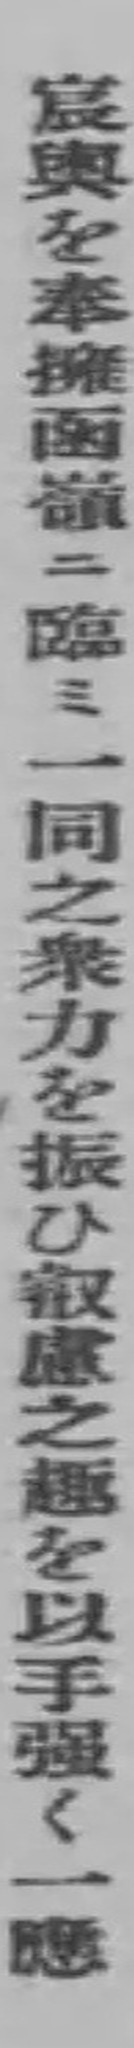宸輿を奉擁函嶺ニ臨み一同之衆力を振ひ叡慮之趣を以手強く一応
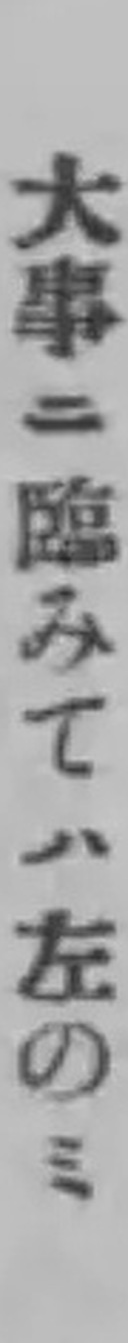大事ニ臨みては左のみ
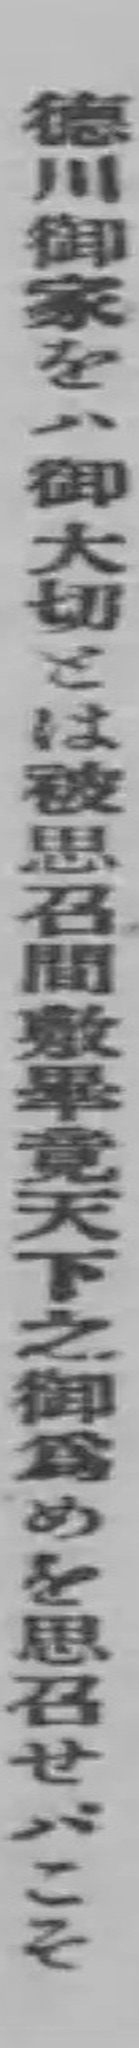徳川御家をは御大切とは被思召間敷畢竟天下之御為めを思召せばこそ
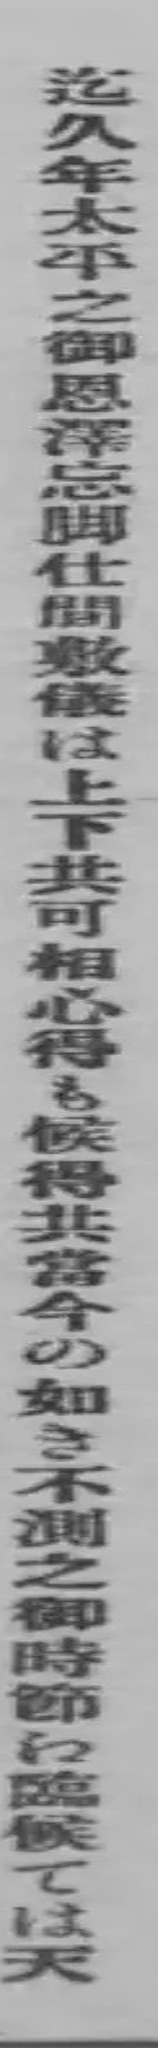迄久年太平之御恩沢忘脚仕間敷儀は上下共可相心得も候得共当今の如き不測之御時節え臨候ては天
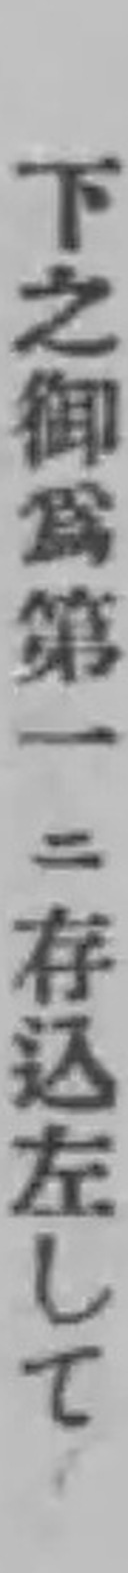下之御為第一ニ存込左して
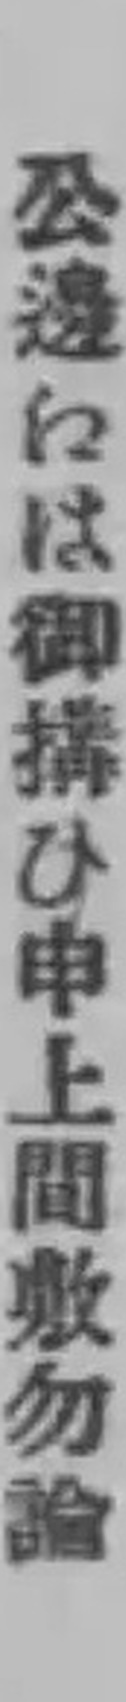公辺えは御搆ひ申上間敷勿論
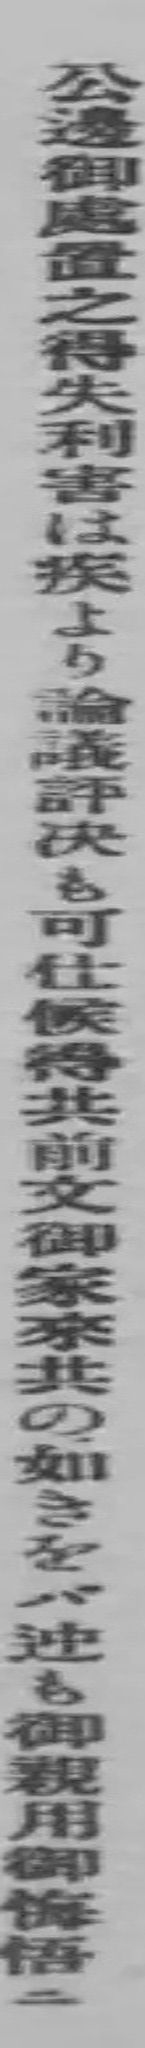公辺御処置之得失利害は疾より論議評決も可仕候得共前文御家来共の如きをば迚も御親用御悔悟ニ
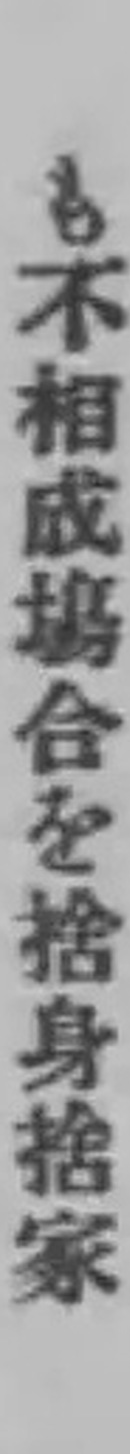も不相応場合を捨身捨家
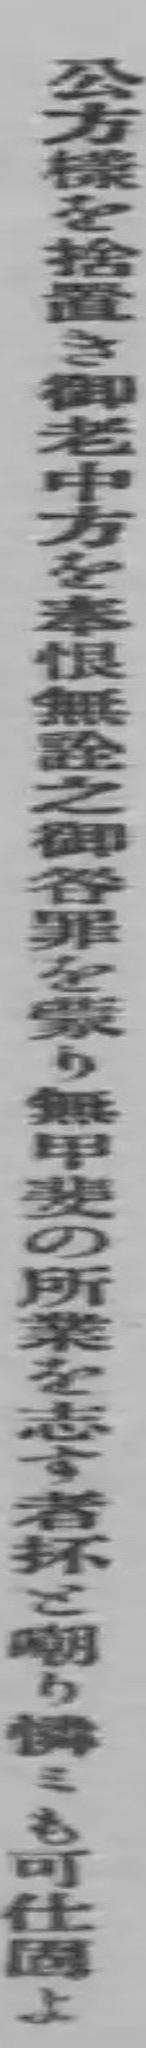公方様を捨置き御老中方を奉恨無詮之御咎罪を蒙り無甲斐の所業を志す者抔と嘲り憐みも可仕固よ

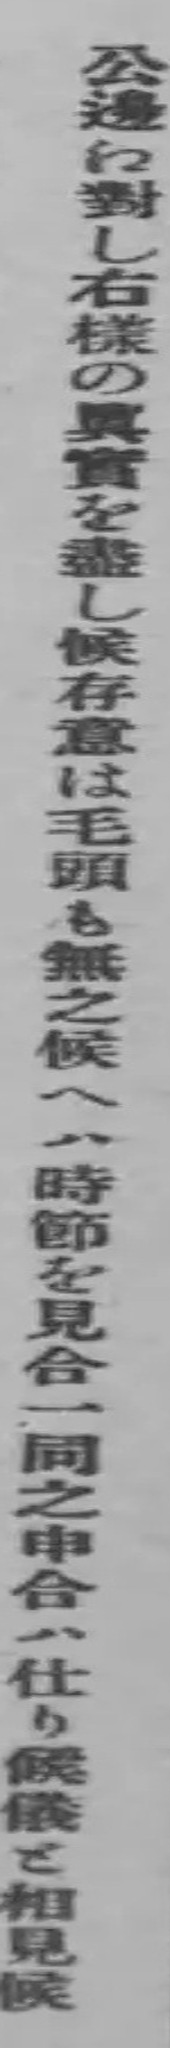公辺え対し右様の真実を尽し候存意は毛頭も無之候へは時節を見合一同之申合は仕り候儀と相見候
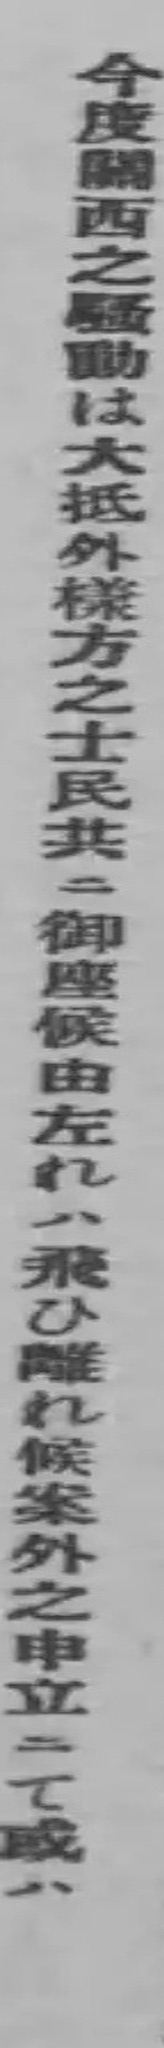今度関西之騒動は大抵外様方之士民共ニ御座候由左れは飛ひ離れ候案外之申立ニて或は
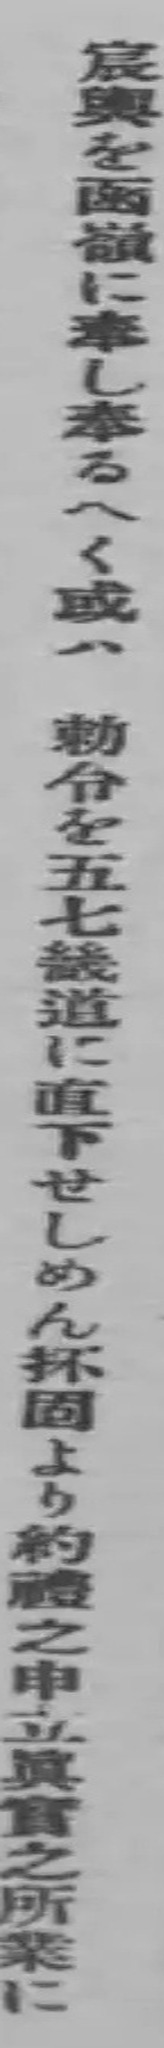宸輿を函嶺に奉し奉るへき或は勅令を五七畿道に直下せしめん抔固より約礼之申立真実之所業に
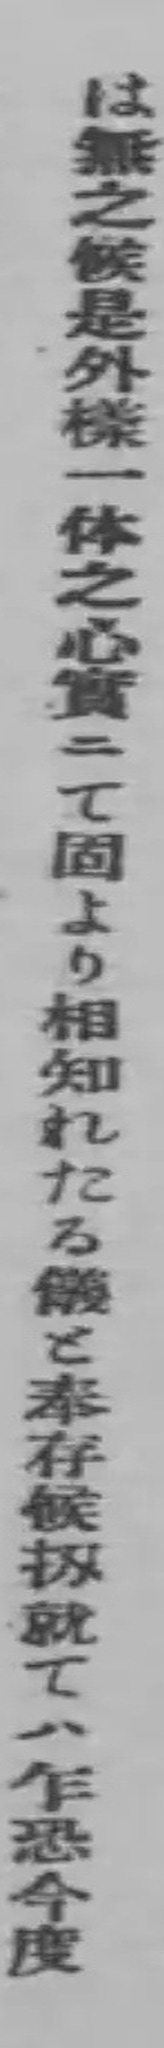は無之候是外様一体之心実ニて固より相知れたる儀と奉存候扨就ては乍恐今度
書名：豊橋市史談
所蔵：国立国会図書館 National Diet Library, JAPAN
